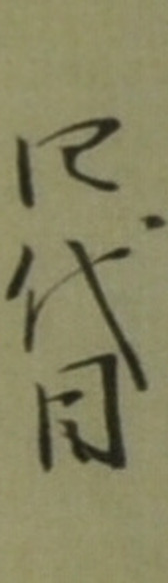四代目

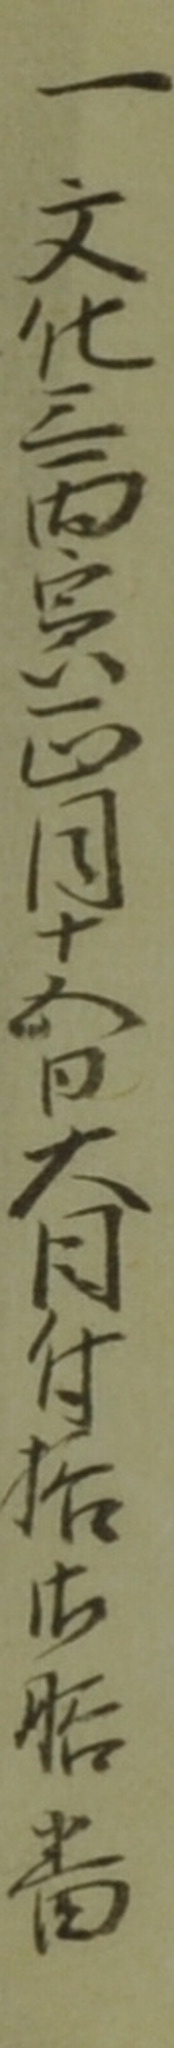一文化三丙正月十五日大目付格御膳番
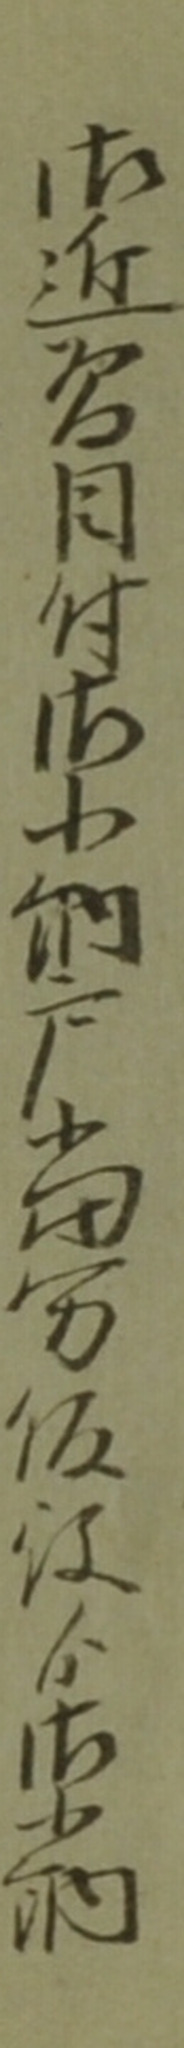御近習召物御小納戸当分仮役より御小納
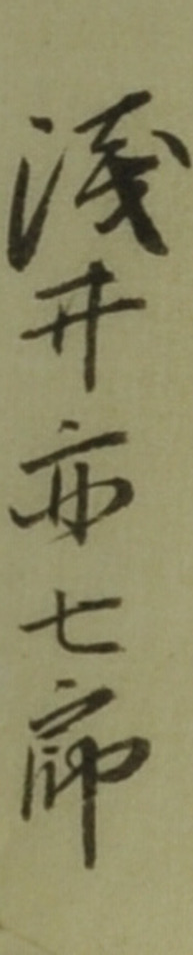浅井亦七郎
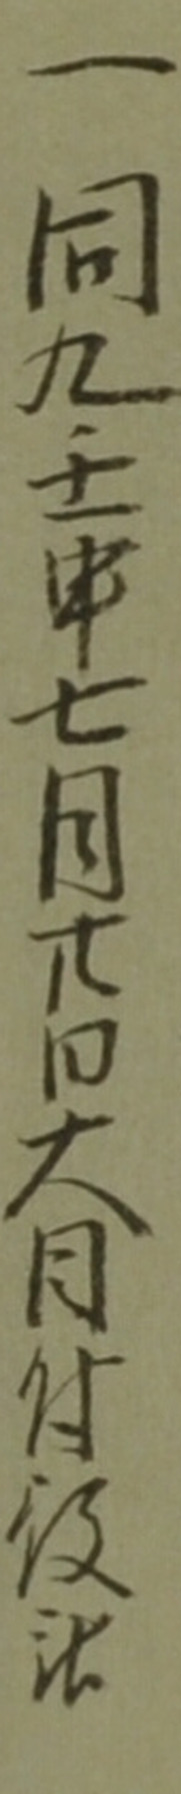一同九壬申七月廿日大目付役被
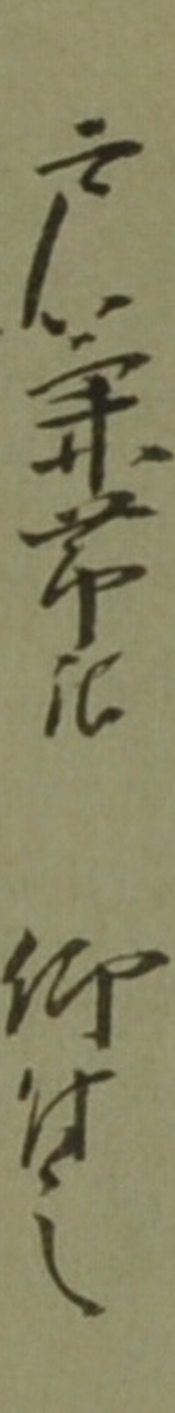戸兼帯被仰付之
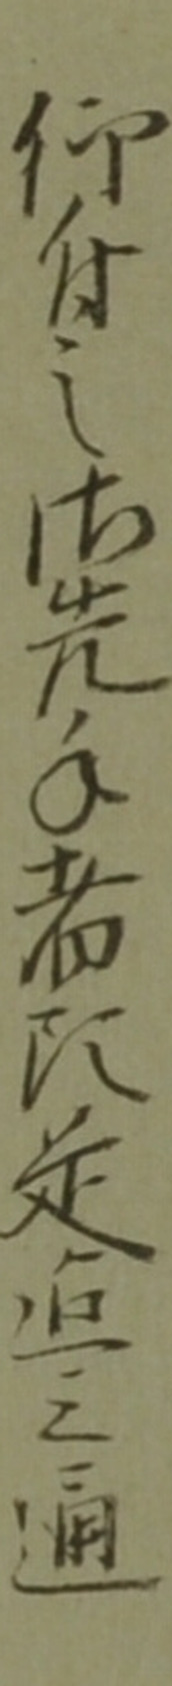仰付之御先手者頭是迄之通
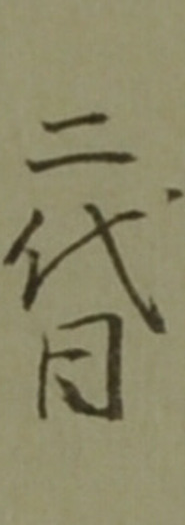二代目
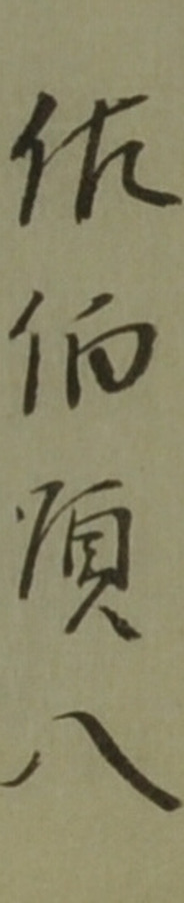佐伯順八
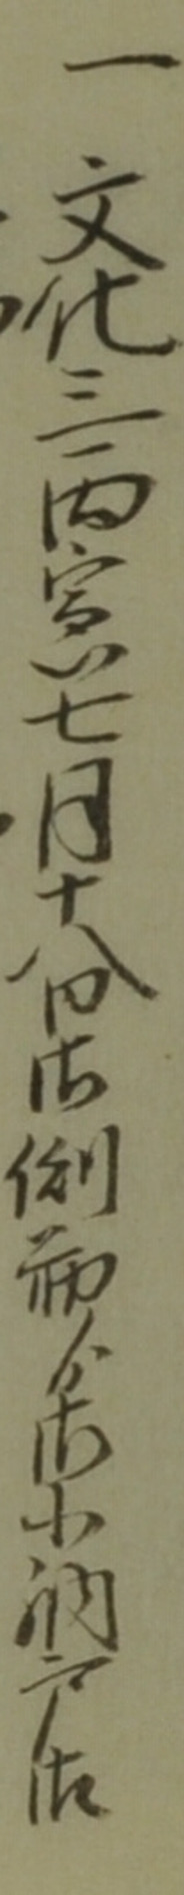一文化三丙寅七月十八日御側勤ゟ御小納戸御
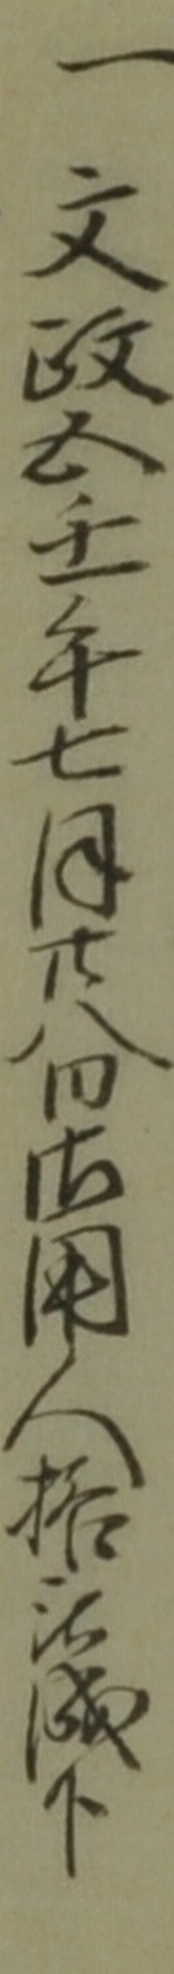一文政五壬午七月廿八日御用人格被成下
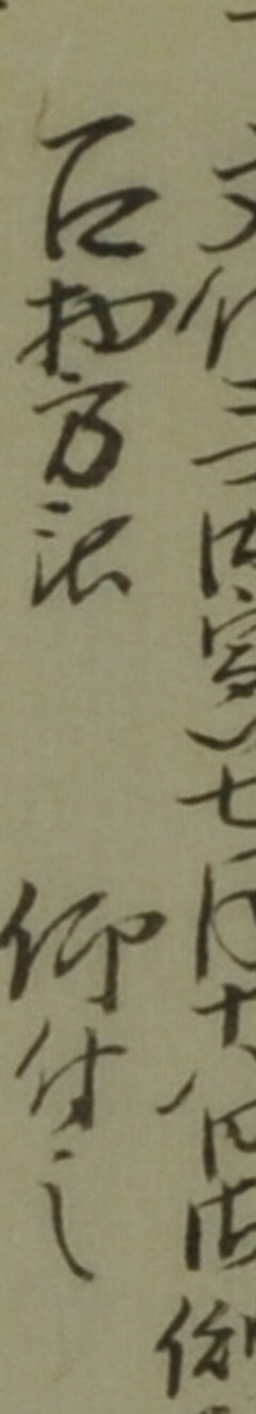召物方被仰付之
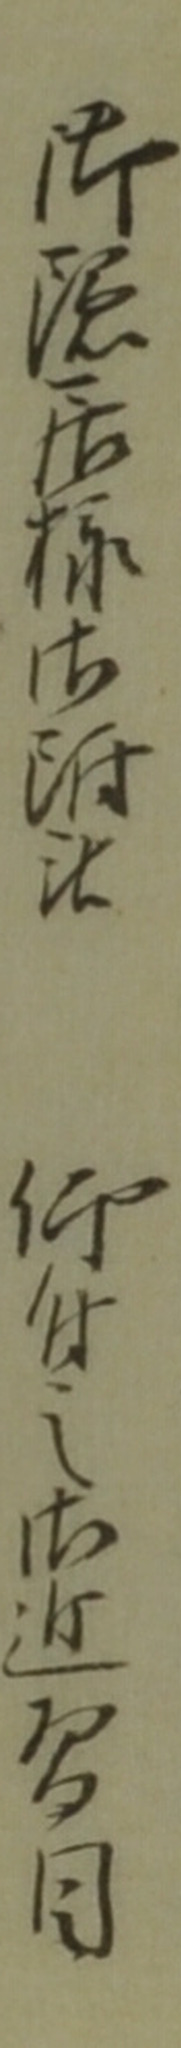御隠居様御附被仰付之御近習目
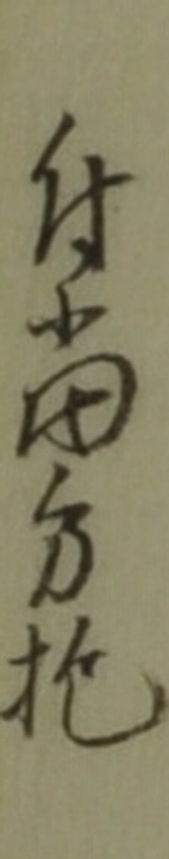付当方抱
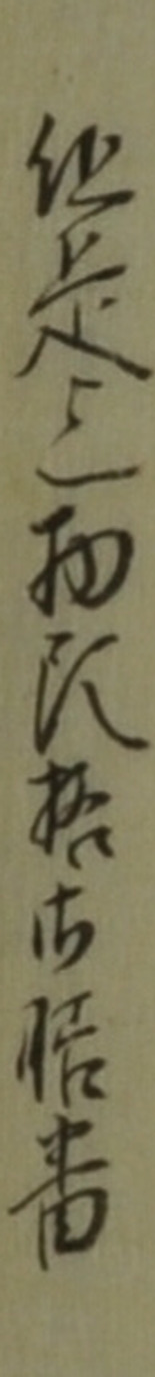但是迄物頭格御膳番
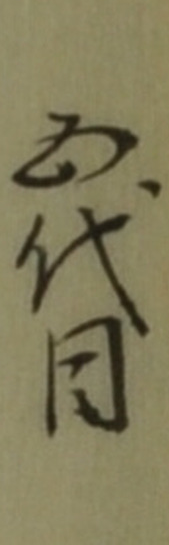五代目
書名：諸御役代々録（四）
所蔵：伊那市立高遠町図書館・合同会社AMANE
